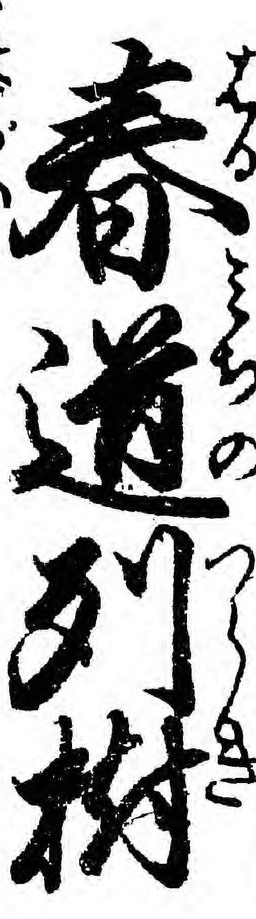春道列樹
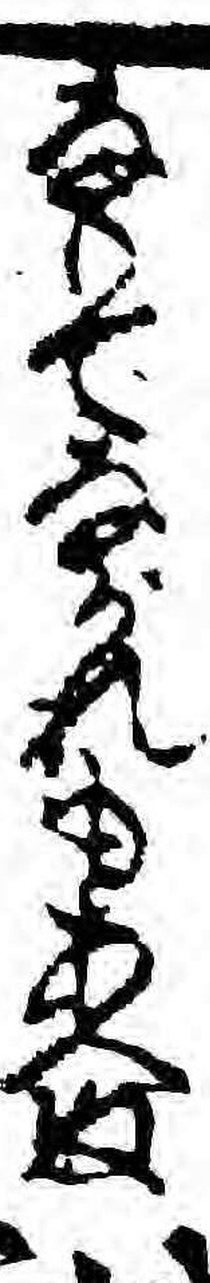なりてながれもあへぬ
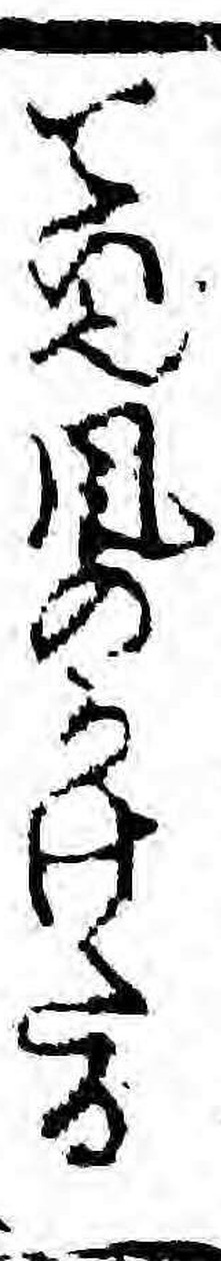てい也風のかけたる
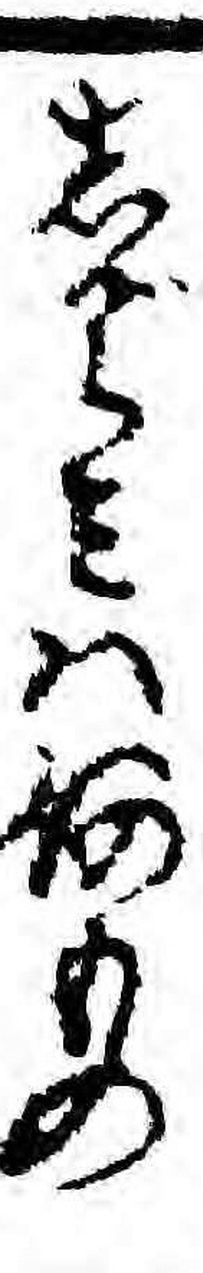しがらみは何もの
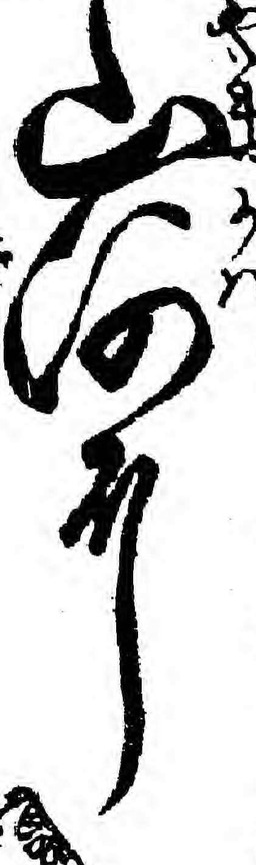山河に
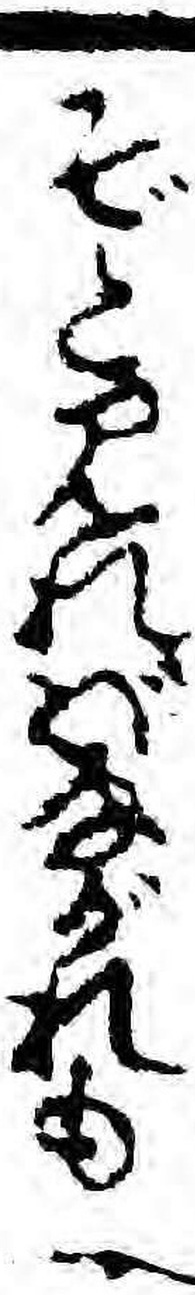ぞと見ればながれも
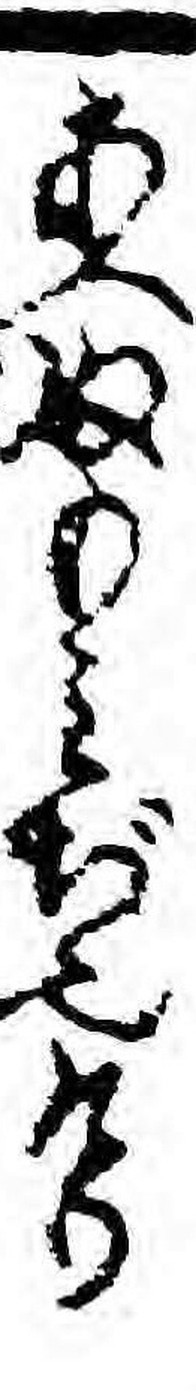あへぬもみぢ也けり
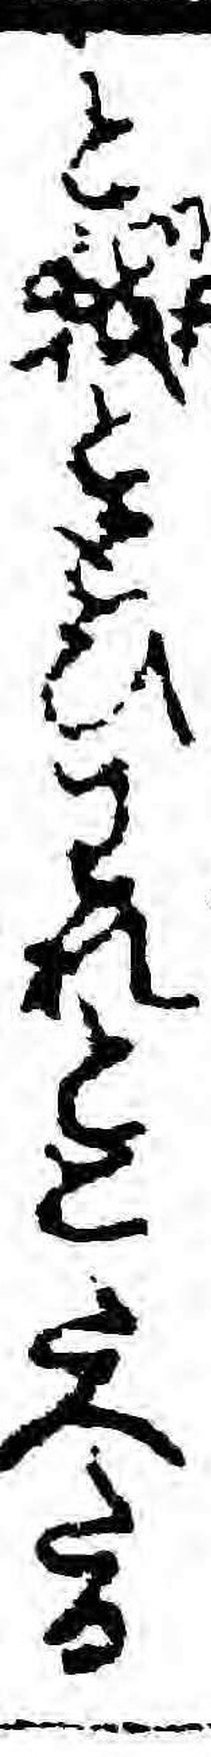と我ととひわれとこたへたる
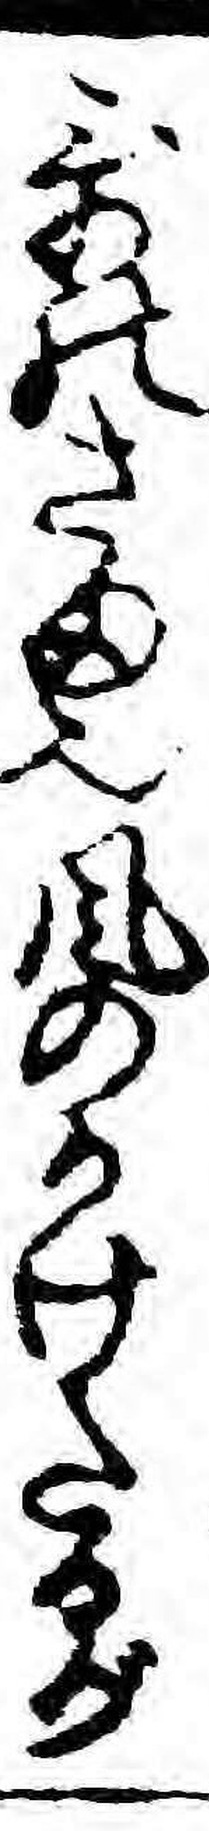哥のさま也風のかけたるが
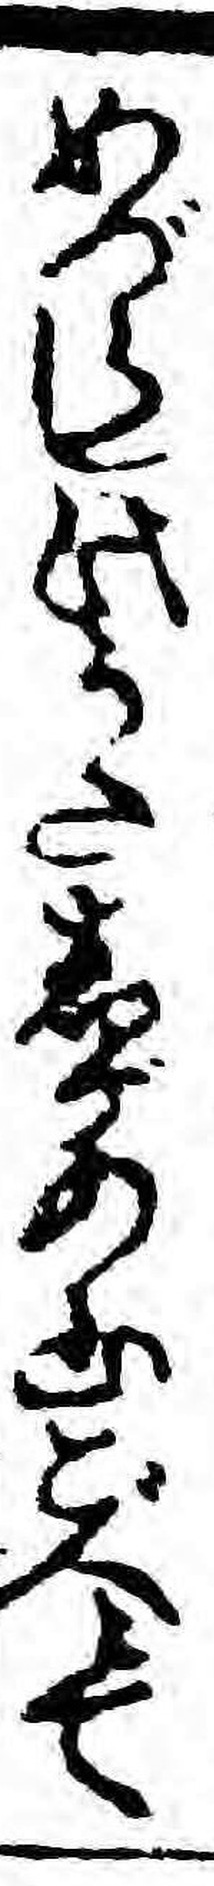めづらし此うたしがの山ごへにて
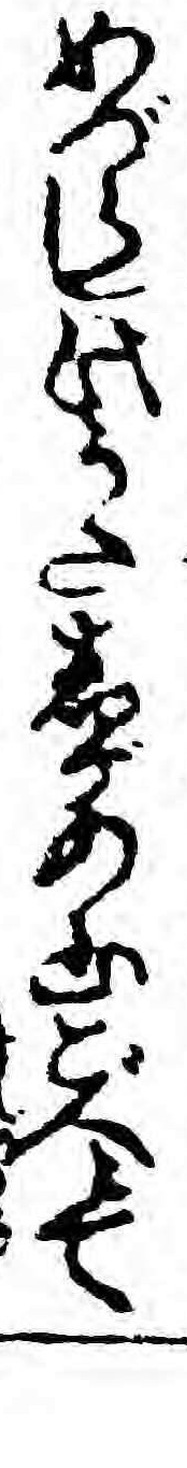めづらし此うたしがの山ごへにて
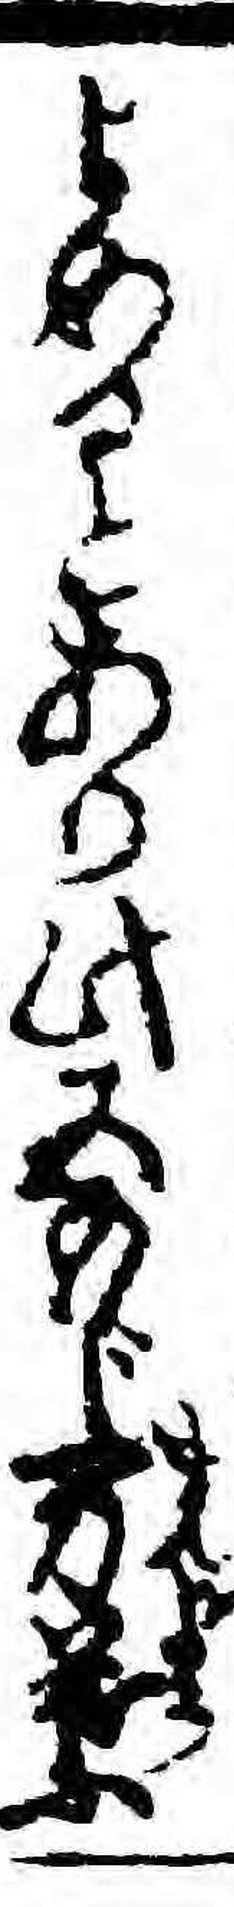よめるとあり此五もじ万葉
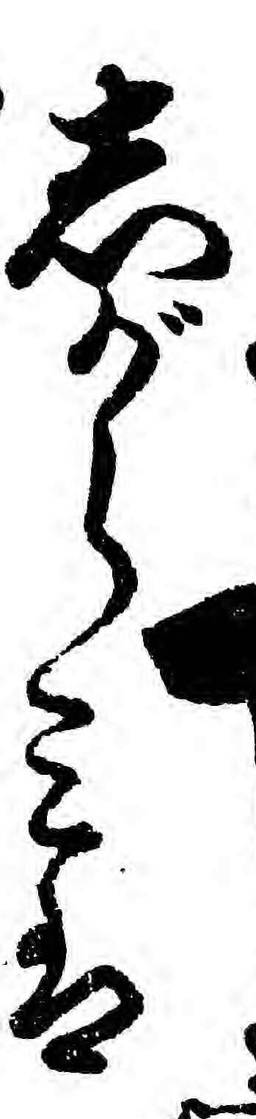しがらみは
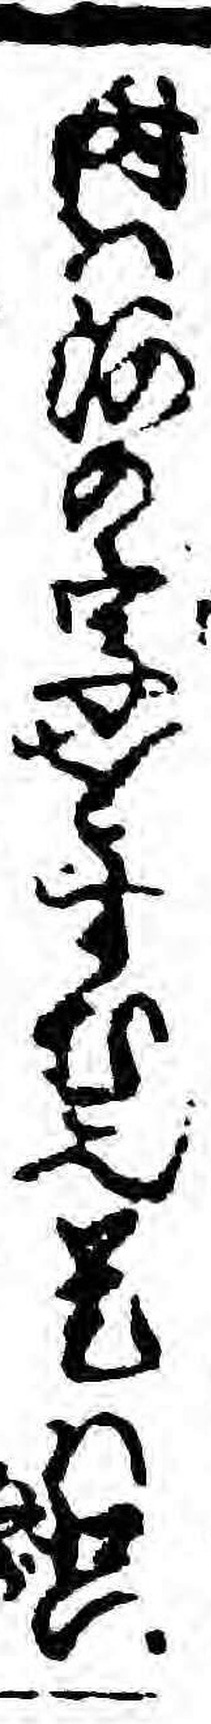時は河の字をすむ也是は只
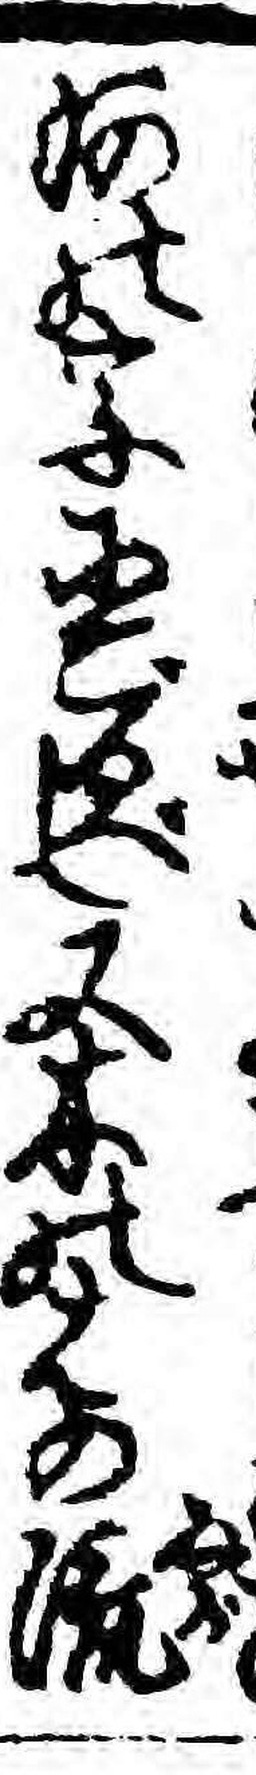河の字にごるべし又木のはの流
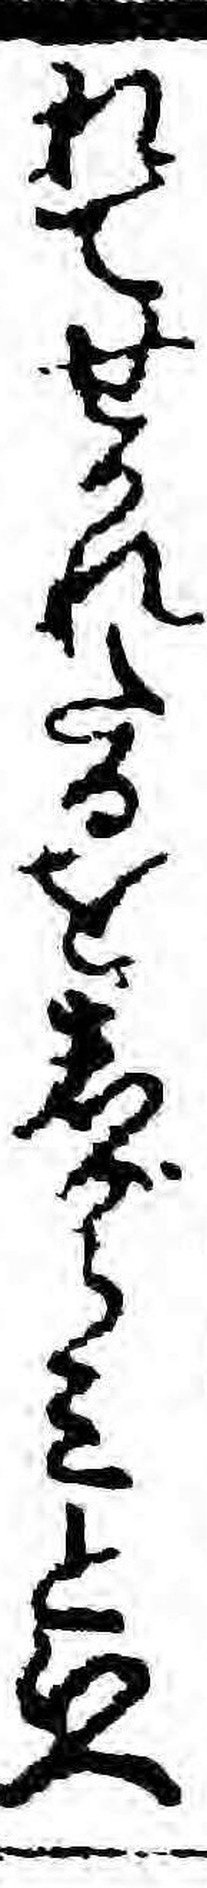れてせかれたるをしがらみといへ
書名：頭書和歌注譯／壽賀多百人一首小倉錦
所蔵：国文学研究資料館
